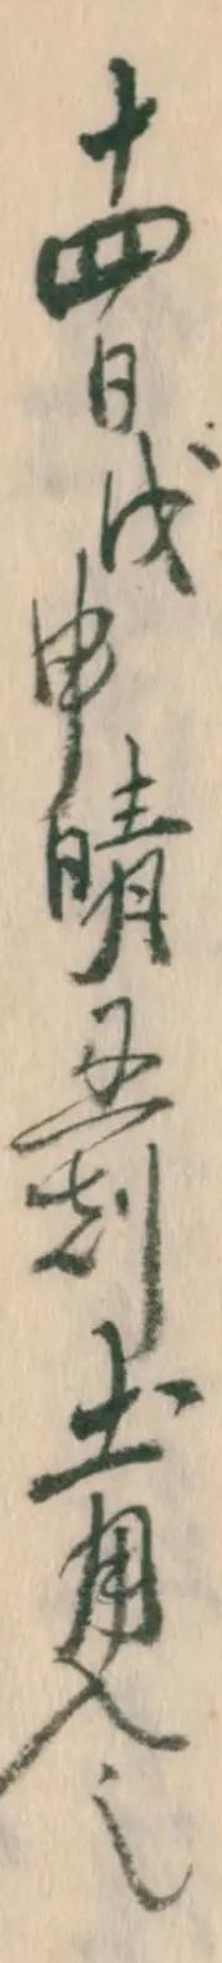十四日戊申晴丑刻出用入也
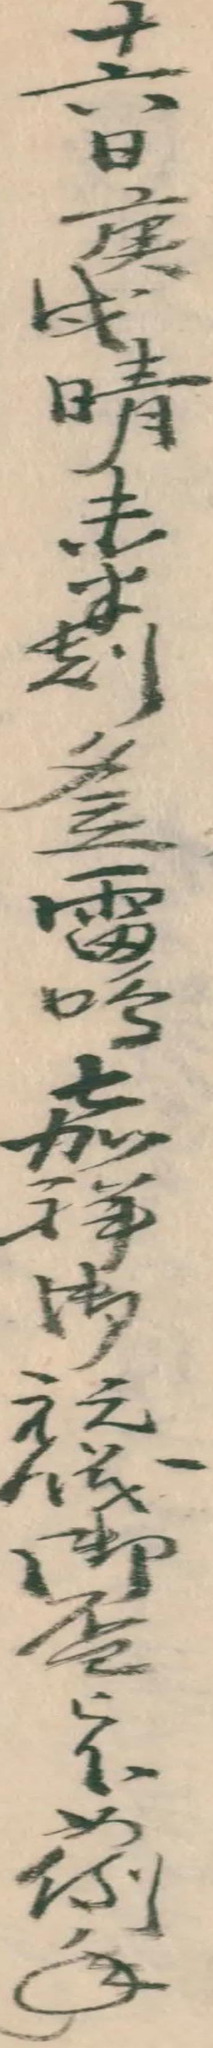十六日庚戌晴未半刻夕立雷鳴嘉祥御祝儀御盃被下如例年
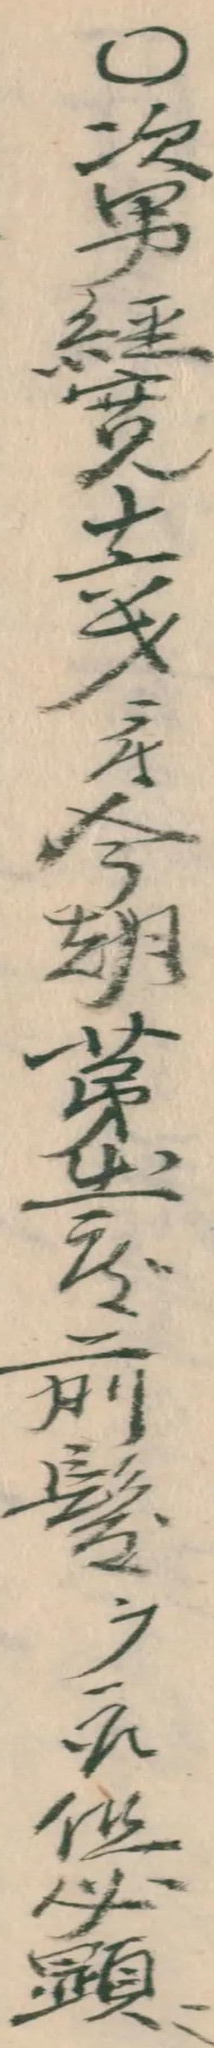○次男経寛十六才に付今朝茅出度前髪を取但必顕
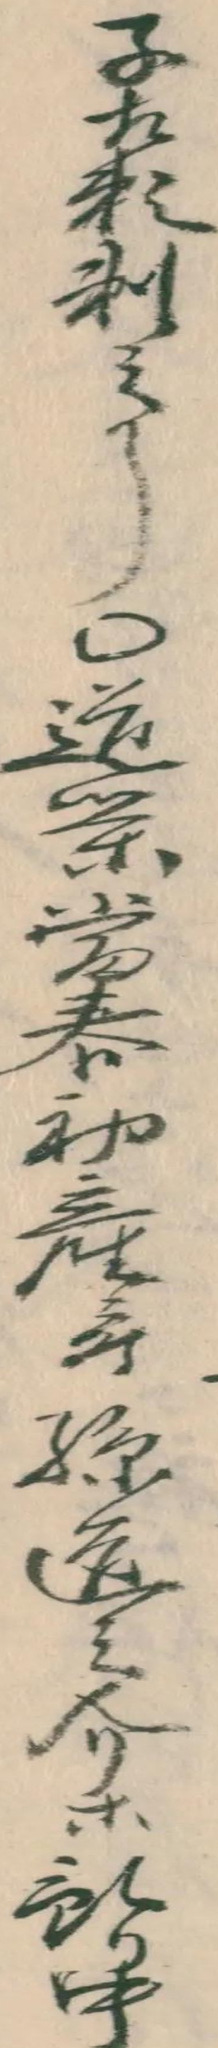子相頼剃之了○道栄當春初産ニ付孫道之介等預り中
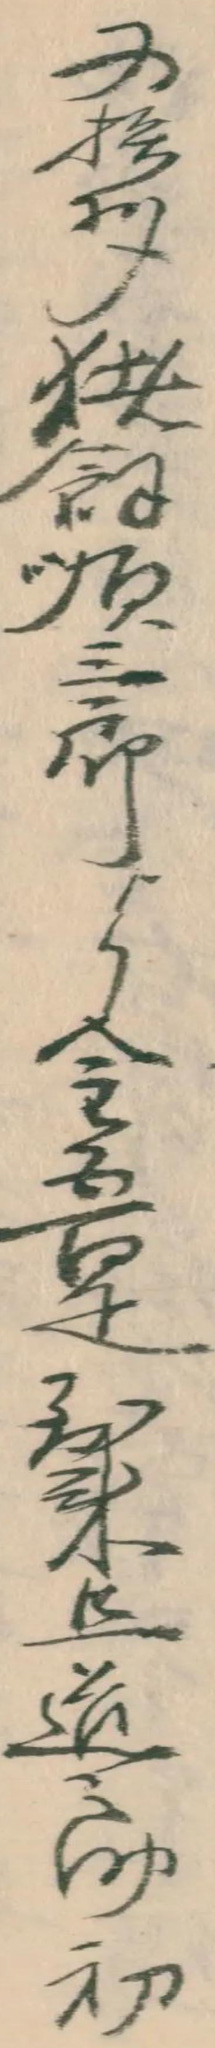為挨拶猪飼順三郎より金五百疋到来且道之助初
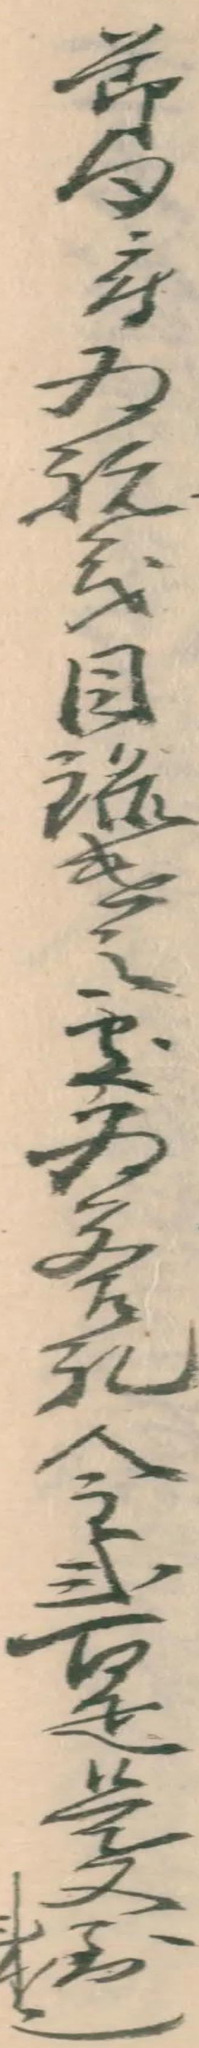節句に付為祝義目録遣之處為答礼金弐百疋是又別来也
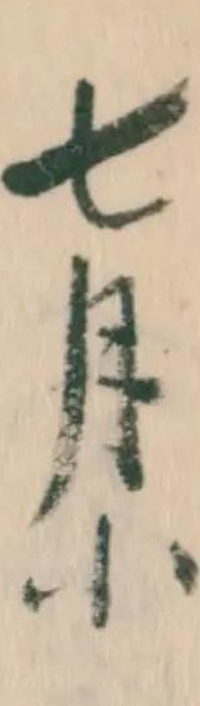七月小
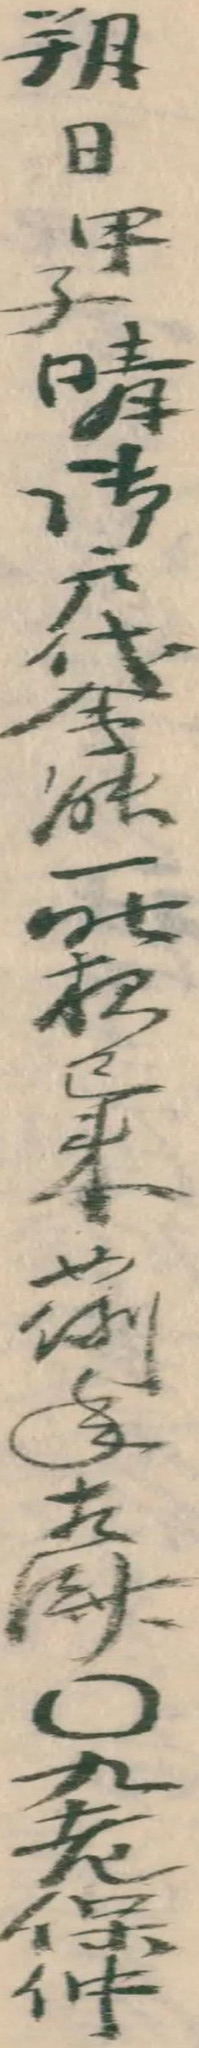朔日甲子晴御戸代會能一昨夜已来如例年相済〇九老保仲
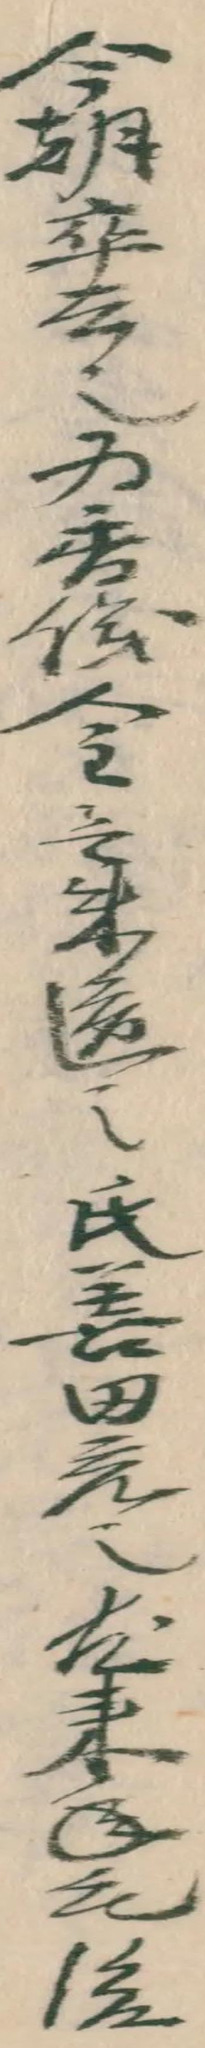今朝卒去也為香儀金来送之朱送之氏善田充也尤来年元後
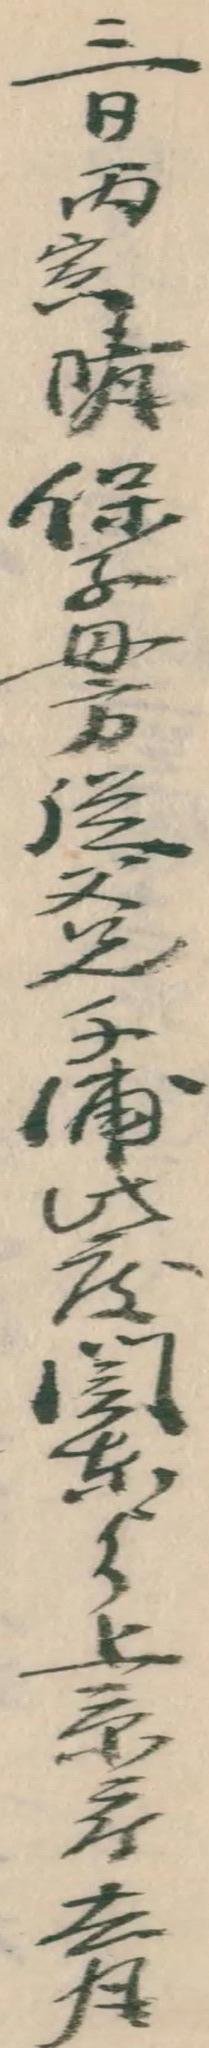三日丙寅晴保子母方従父兄子浦此度関東より上京ニ付去月
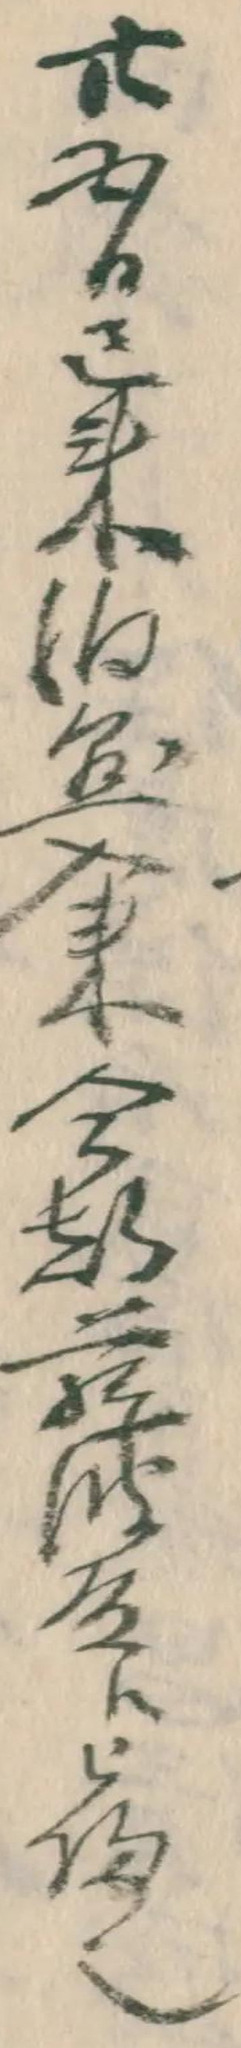廿五日已来泊置入来今朝藤波殿え被帰也
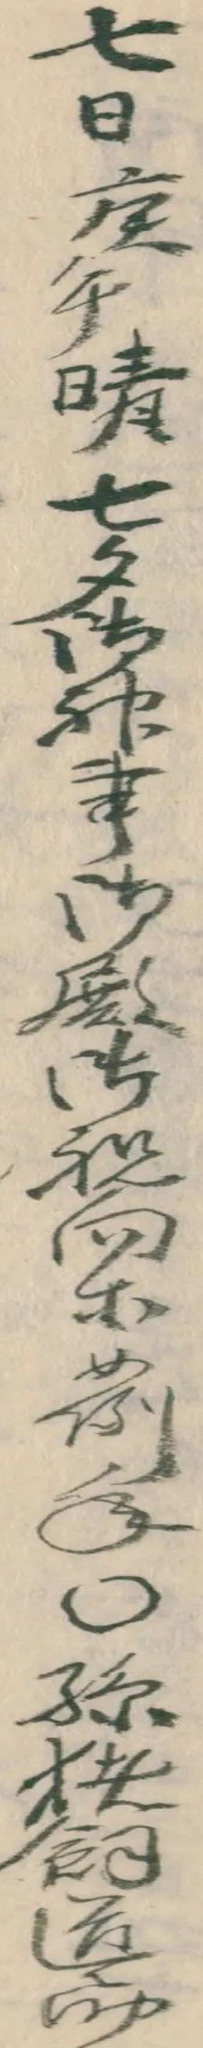七日庚午晴七夕御神事御殿御祝向等如例年○孫猪飼道之助
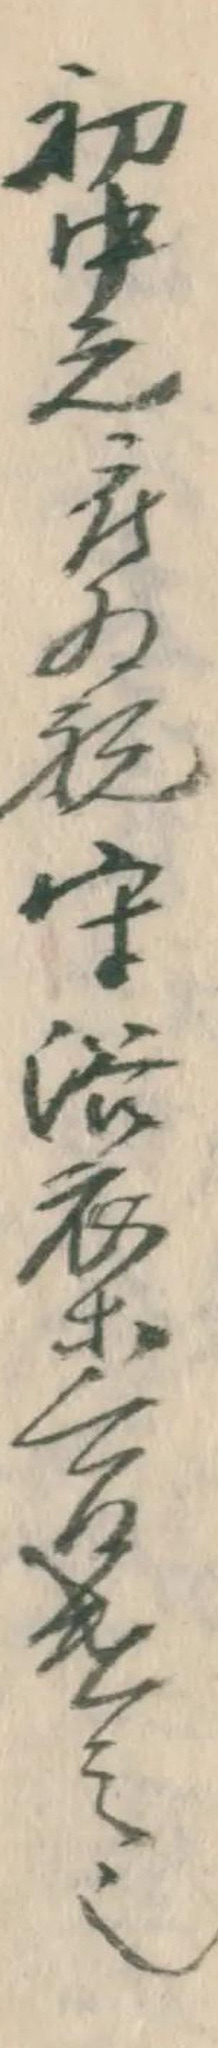初中元ニ付為祝守浴衣等今日遣之也
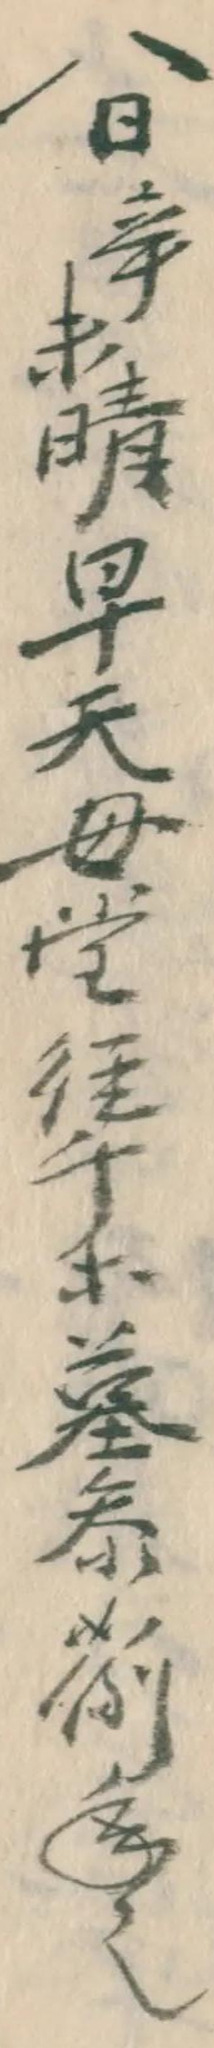八日辛未晴早天母堂経千等墓参如例年也
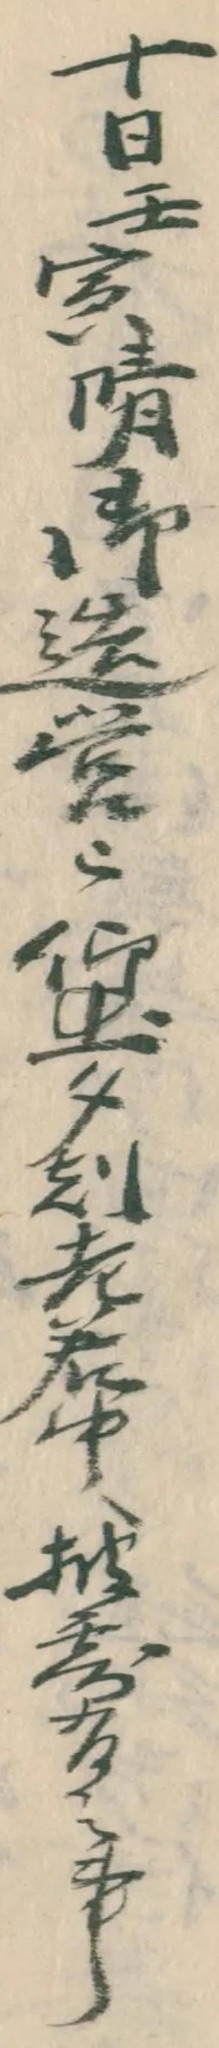十日壬寅晴御造営被仰出夕刻老君中へ披露有之事
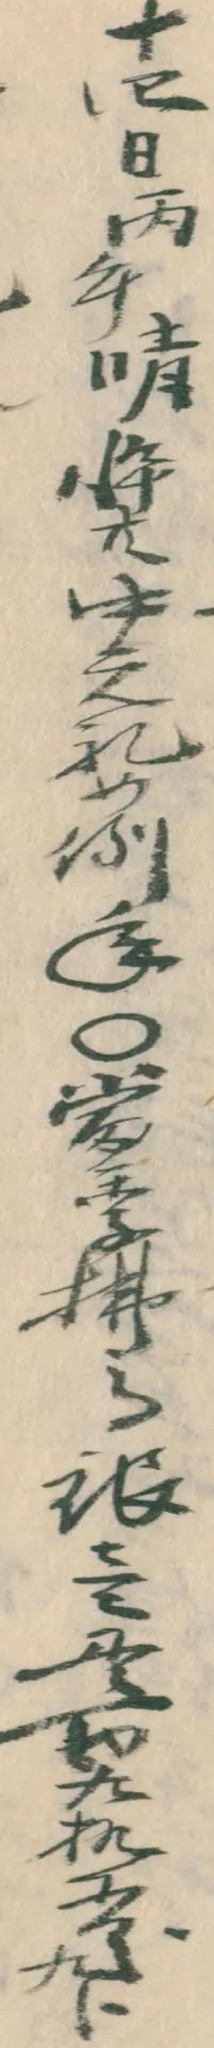十四日丙午晴忰共中元礼如例年○當季払高銀壱貫百九拾五匁丸分
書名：賀茂社記録. 第66冊
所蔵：国立国会図書館 National Diet Library, JAPAN
